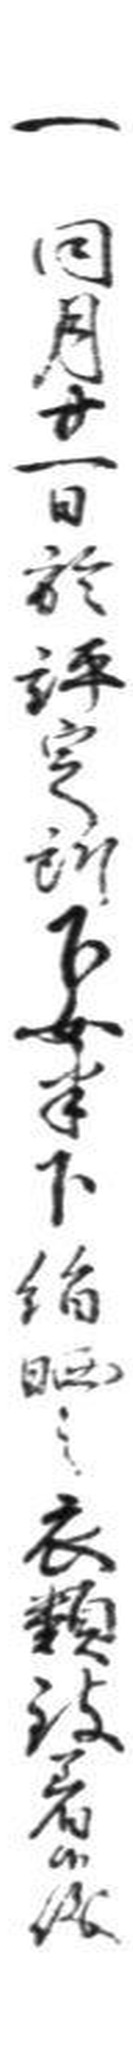一同月廿一日於評定所下女半下絹晒之衣類致着候儀
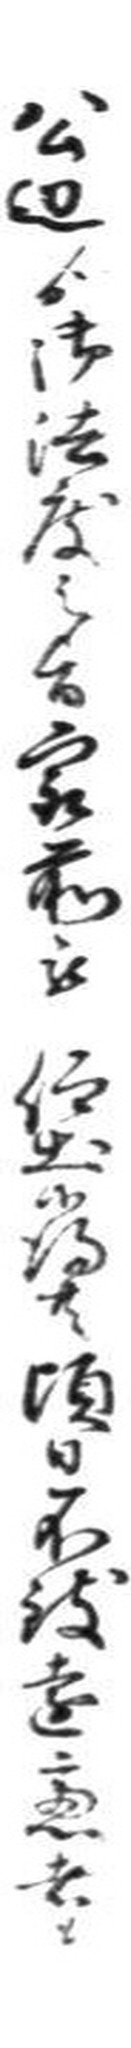公辺ゟ御法度之旨最前被仰出候得共頃日不致遠慮者も
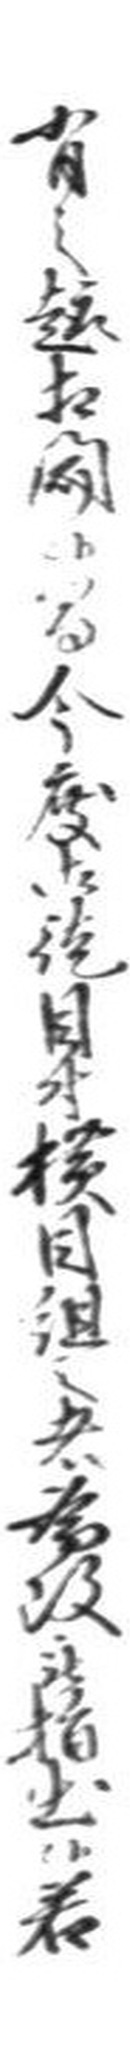有之趣相聞候間今度御徒目付横目組之者為改被指出候若
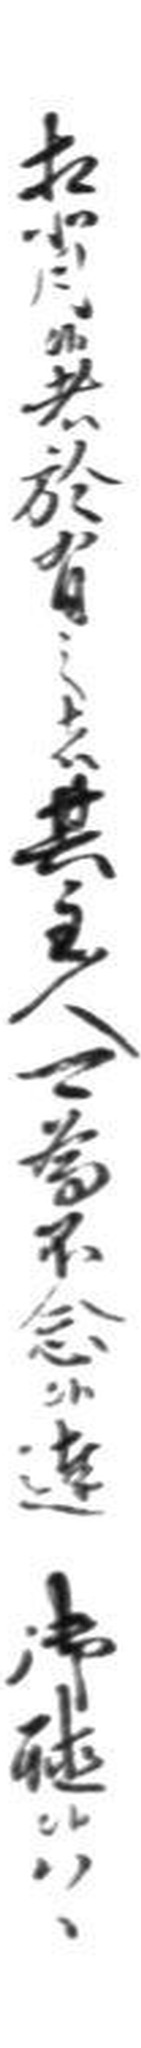相背候者於有之者其主人可為不念候達御聴候ハヽ
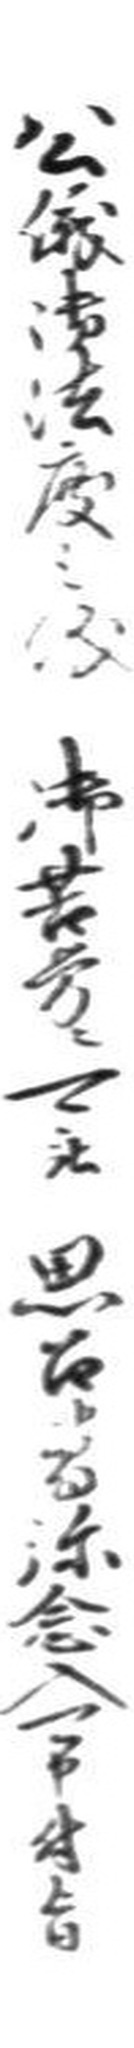公儀御法度之儀御苦労ニ可被思召候間御念入可申付旨
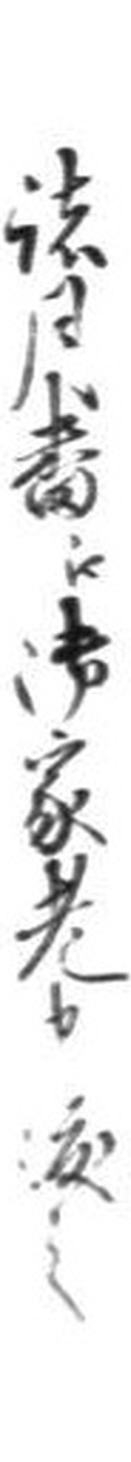諸月番江御家老申渡之
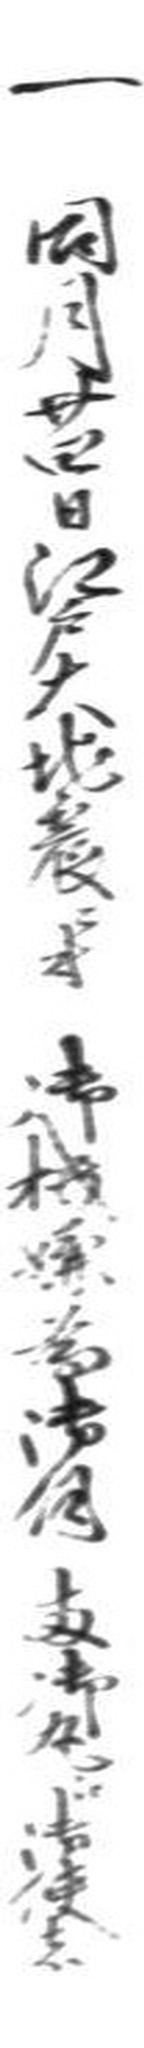一同月廿四日江戸大地震ニ付御機嫌為御伺両御丸江御使者
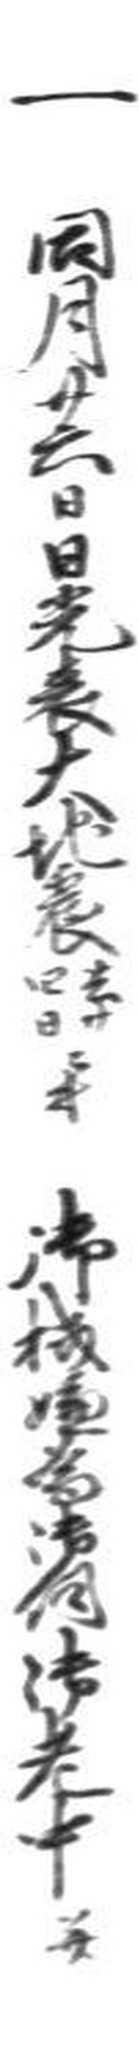一同月廿六日日光表大地震去廿四日ニ付御機嫌為御伺御老中并
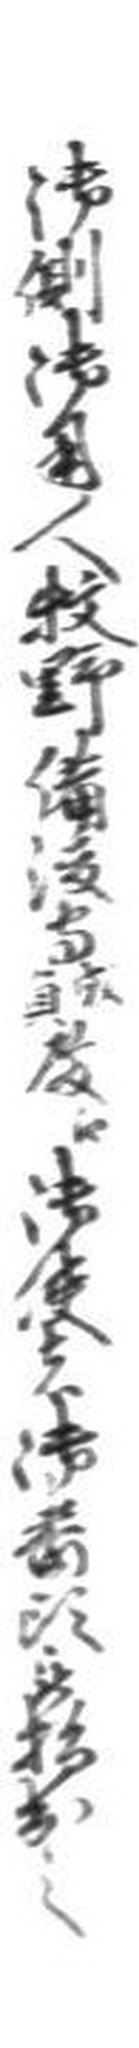御側御用人牧野備後守成貞殿江御使者御番頭被指出之
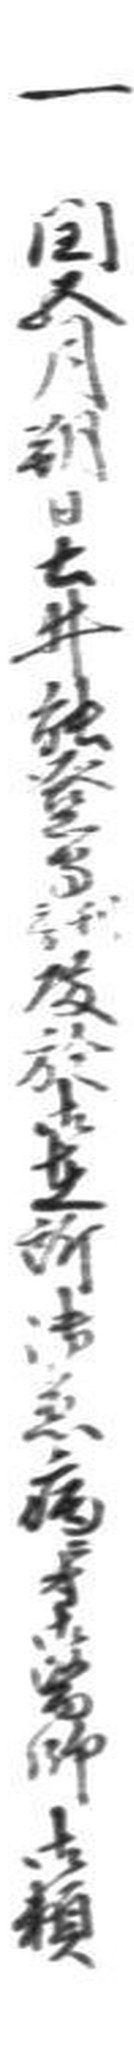一閏五月朔日土井能登守利房殿於御在所御急病ニ付御医師御頼

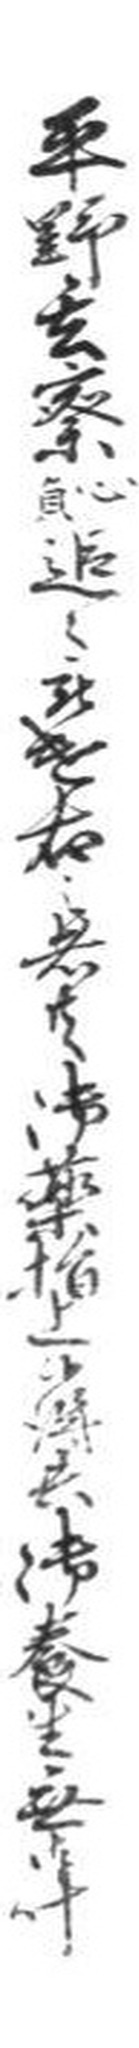平野玄察心貞追々被遣右之者共御薬指上候得共御養生無御叶
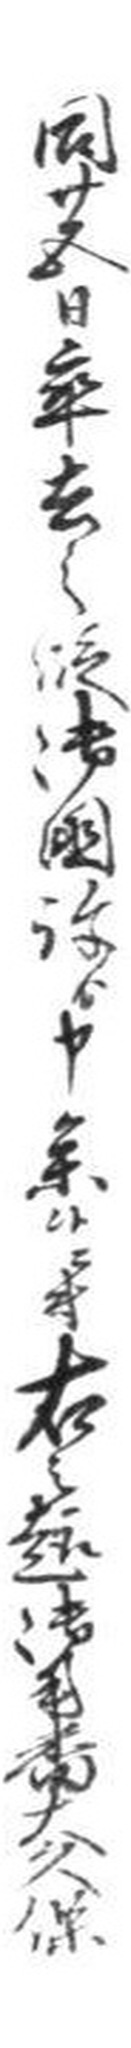同廿五日卒去之段御国許ゟ申来候ニ付右之趣御用番大久保
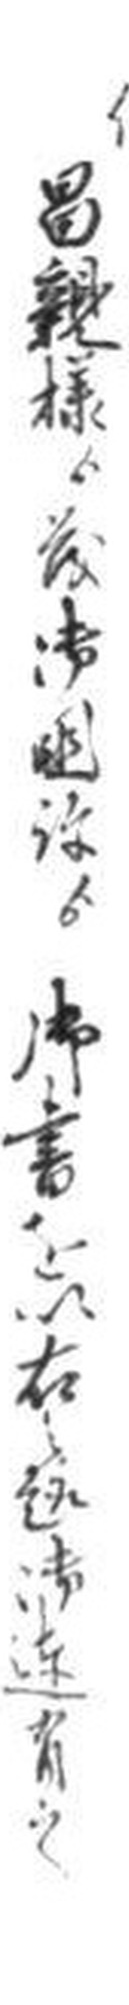但昌親様ゟも御国許ゟ御書を以右之趣御達有之
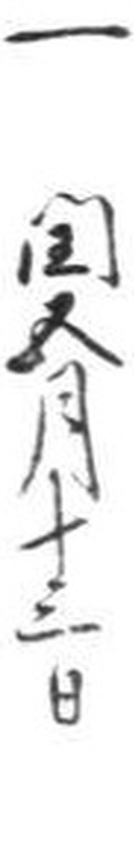一閏五月十三日
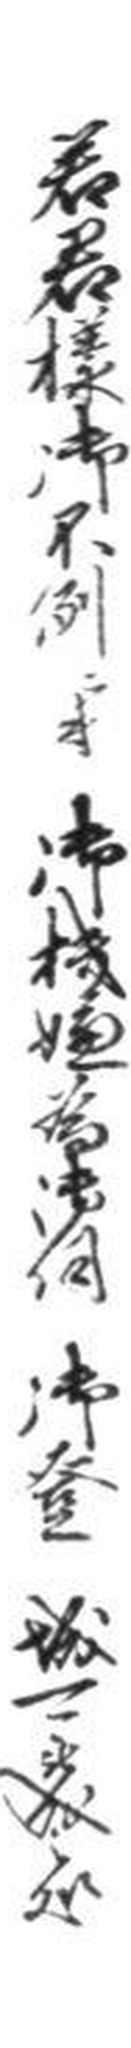若君様御不例ニ付御機嫌為御伺御登城可被成之処
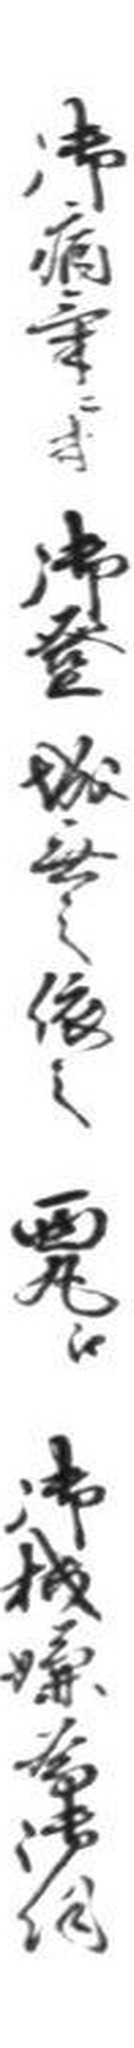御病気ニ付御登城無之西丸江御機嫌為御伺
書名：家譜 十五 綱昌公 従天和元年到元禄十二年
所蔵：福井県文書館 Fukui Prefectural Archives
